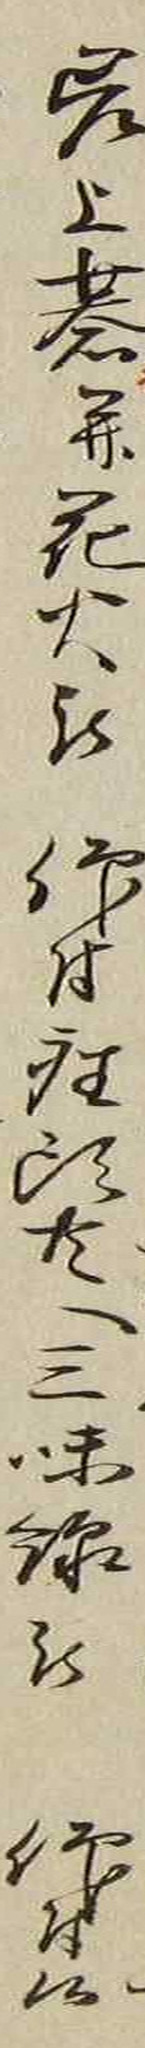差上碁并花火被仰付座頭共へ三味線被仰付候
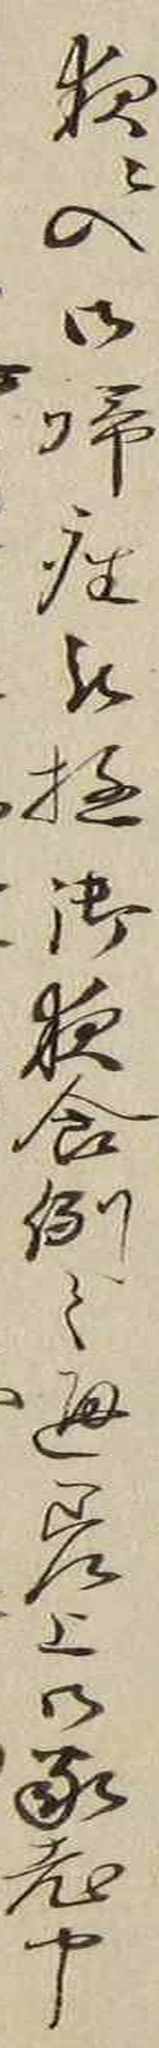夜に入御帰座被遊御夜食例之通差上御家老中
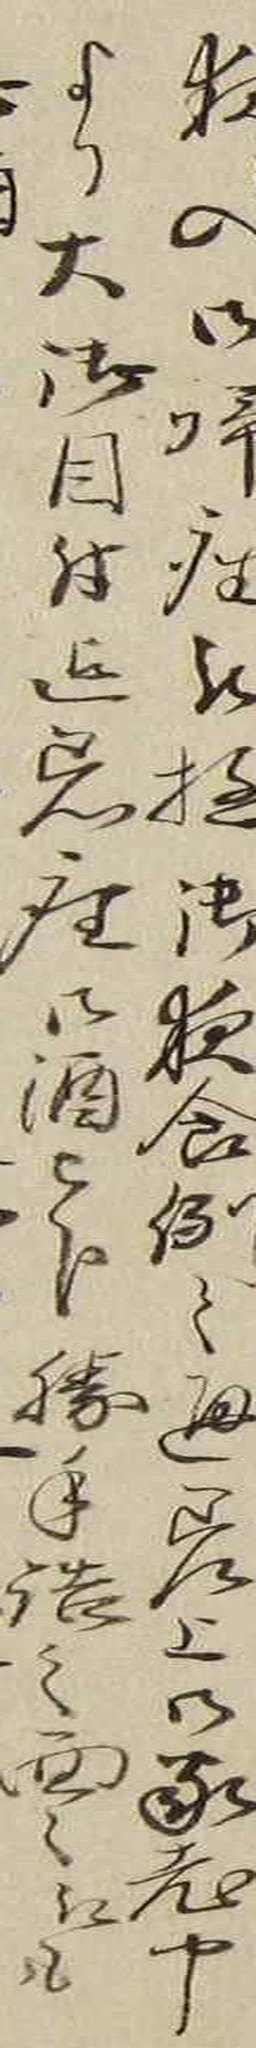より大御目付迄着座御酒被下勝手詰之面々江も
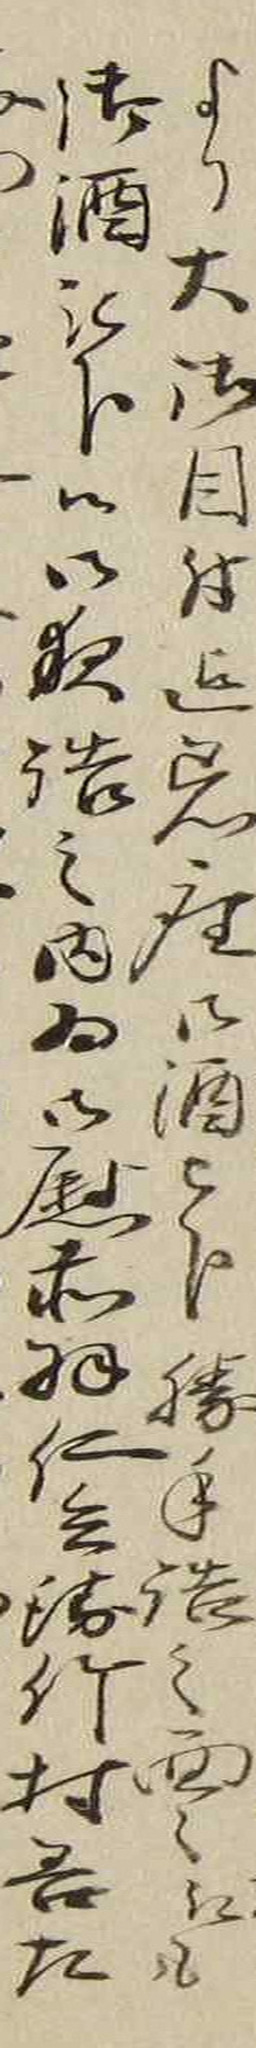御酒被下候御夜詰之為為御慰赤羽仁兵衛竹村善左
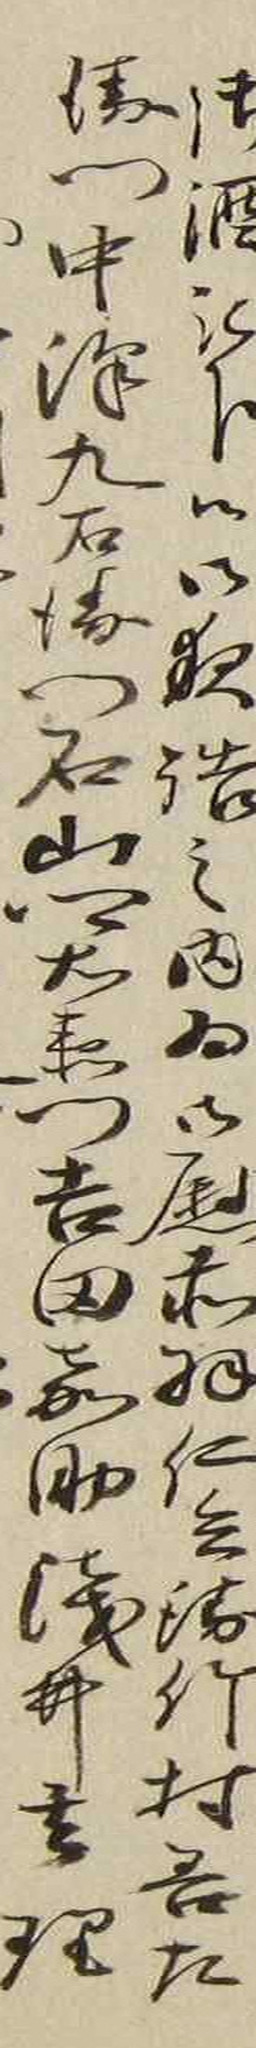衛門中沢九右衛門石山郷右衛門吉田嘉助浅井玄理
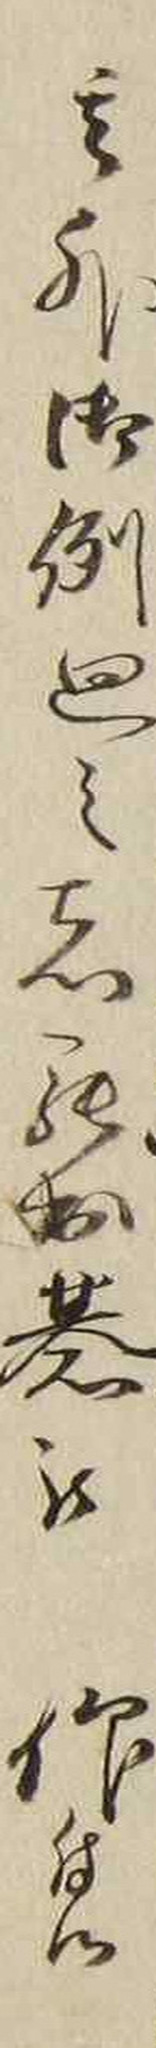其外御側廻之者罷出碁被仰付候

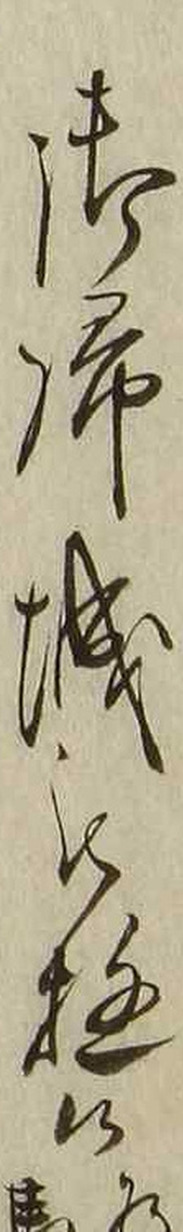御帰城被遊候事
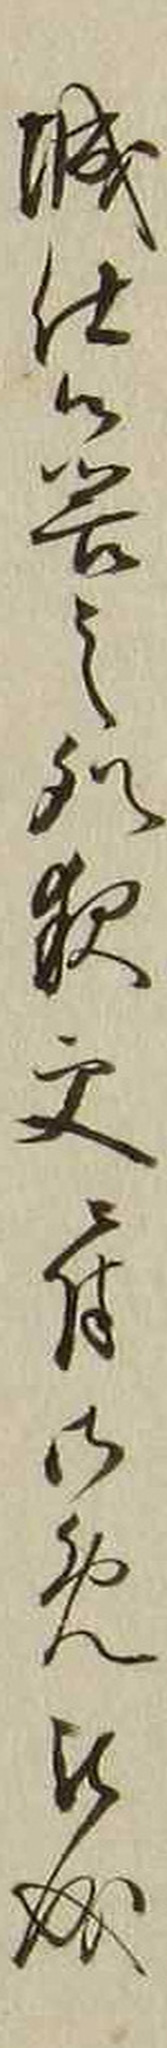城仕候筈之処夜更に付御免被成
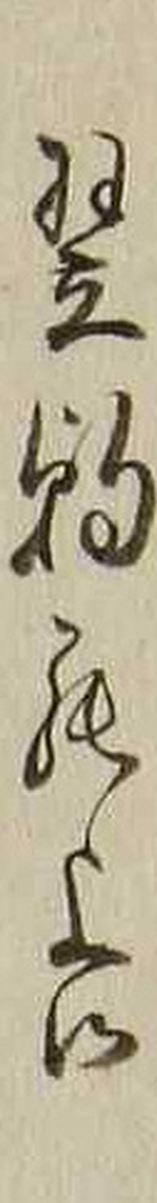翌朝罷上候
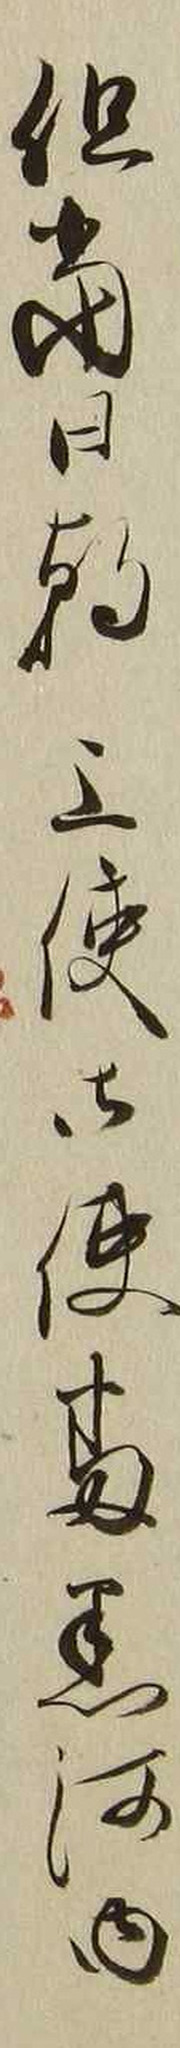但当日朝上使御使番黒河内
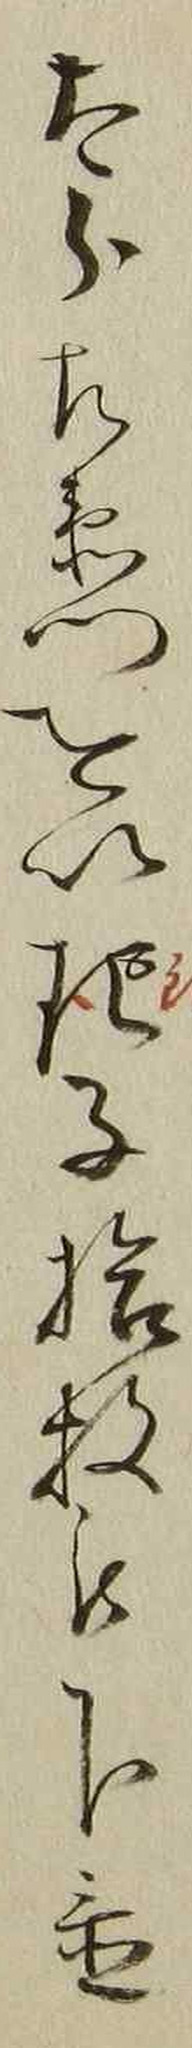太郎左衛門を以理子拾枚被下置
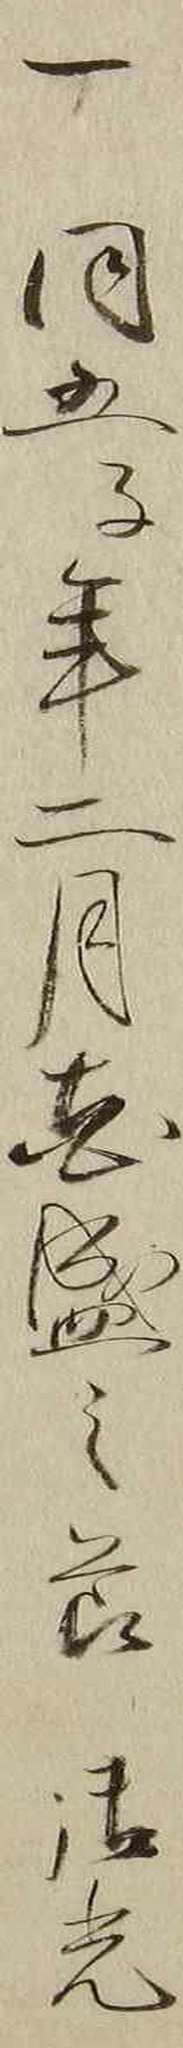一同五子年二月花盛之節御光
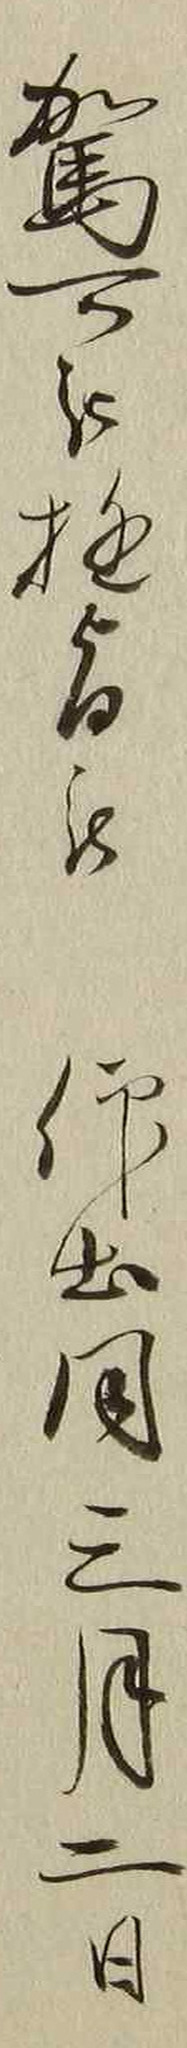駕可被遊旨被仰出同三月二日
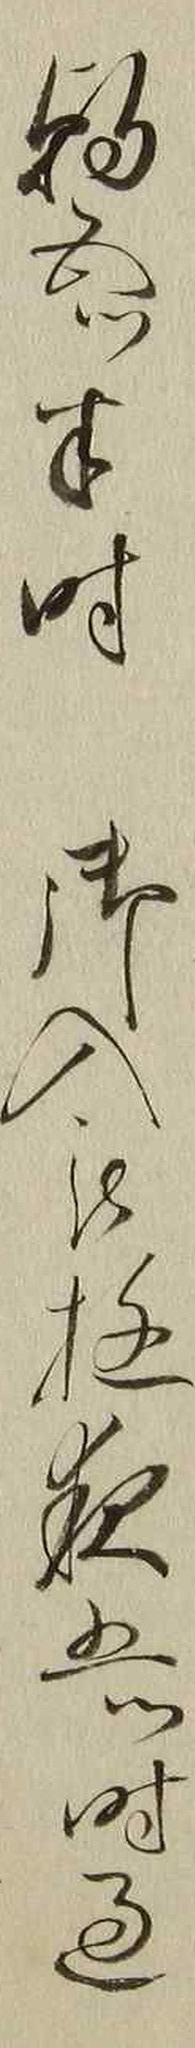朝五ッ半時御入被遊夜五ッ時過
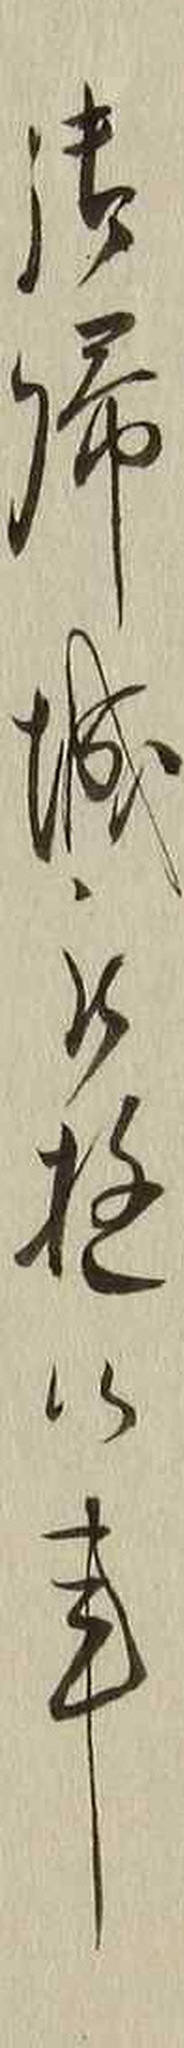御帰城被遊候事
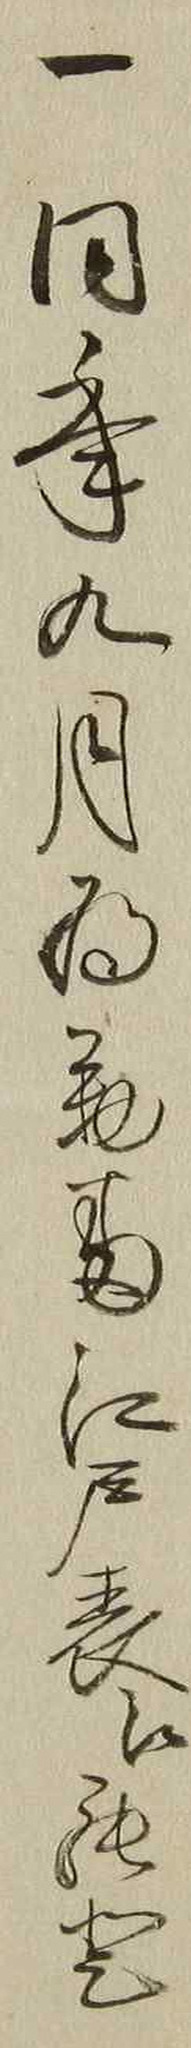一同年九月為勤番江戸表へ罷登
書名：諸士系譜　巻之103　か之部11
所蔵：会津若松市立会津図書館
